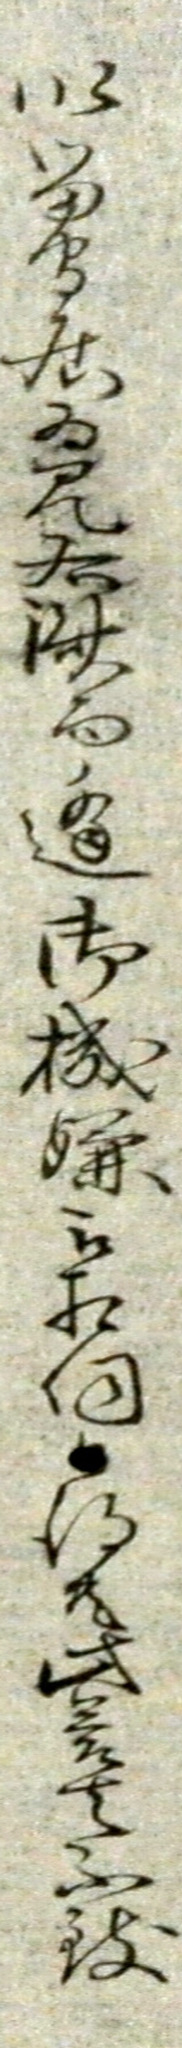以留守居為見右済而逢御機嫌被相伺候得共此答は不致
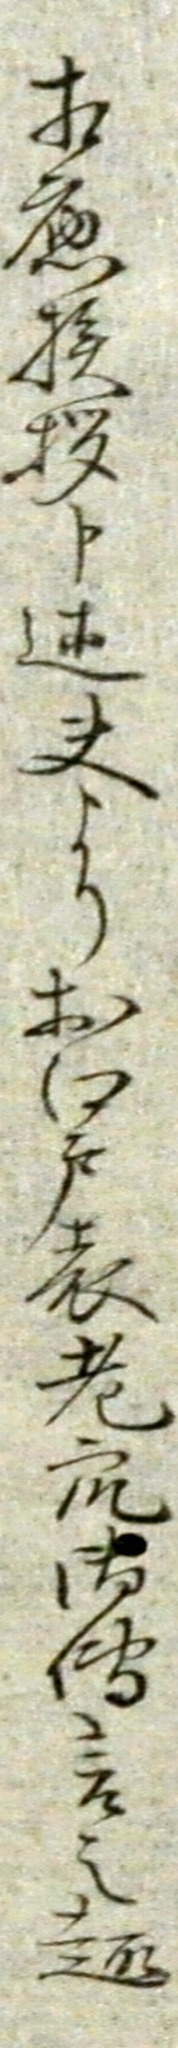相応挨拶申述夫よりお江戸表老衆御伝言之趣
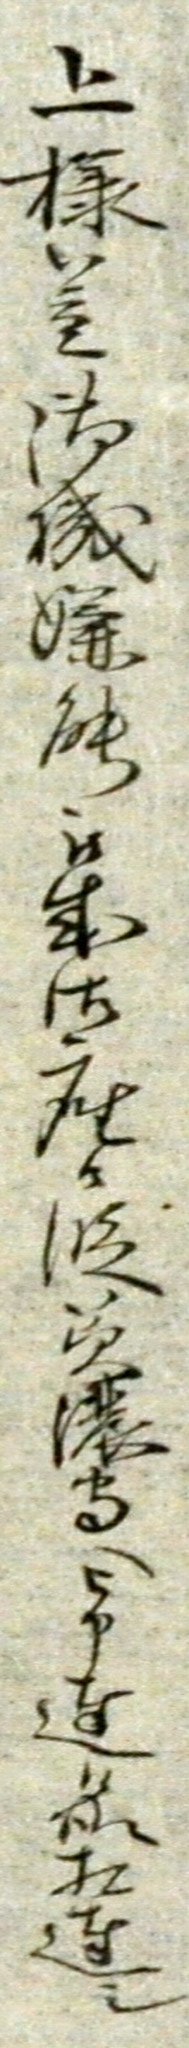上様益御機嫌能被成御座候段美濃守へ被申達候様相達シ
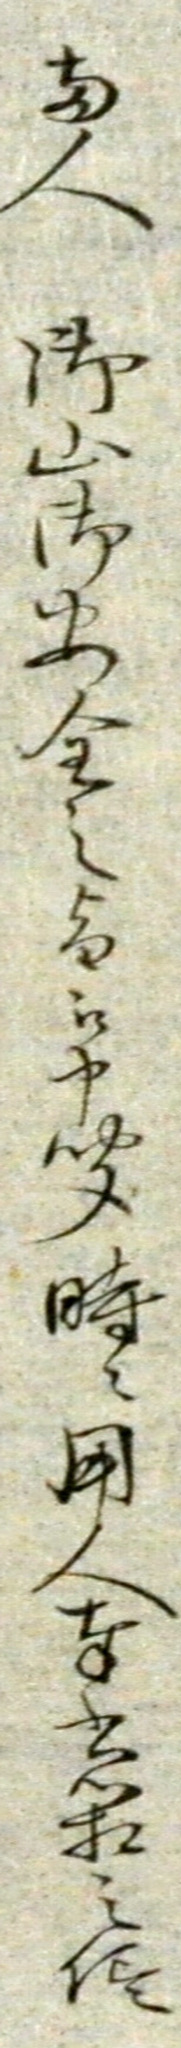両人御山御安全之旨被申聞時ニ用人奉書箱之儘
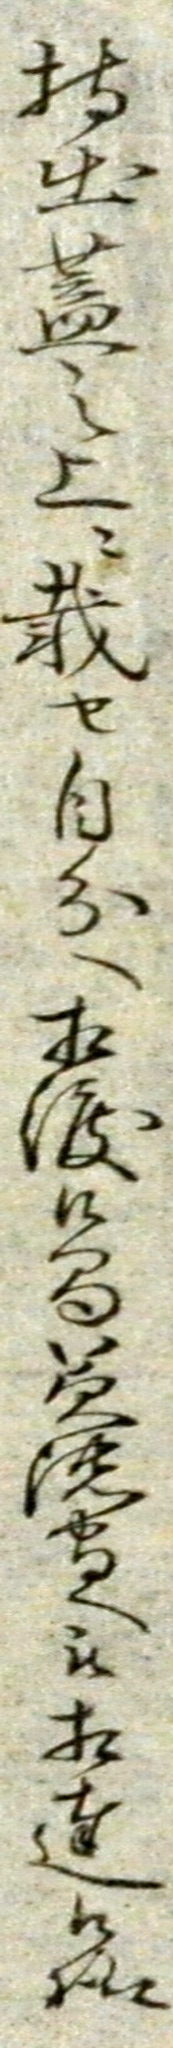持出蓋之上ニ載セ自分へ相渡候間美濃守へ被相達候様
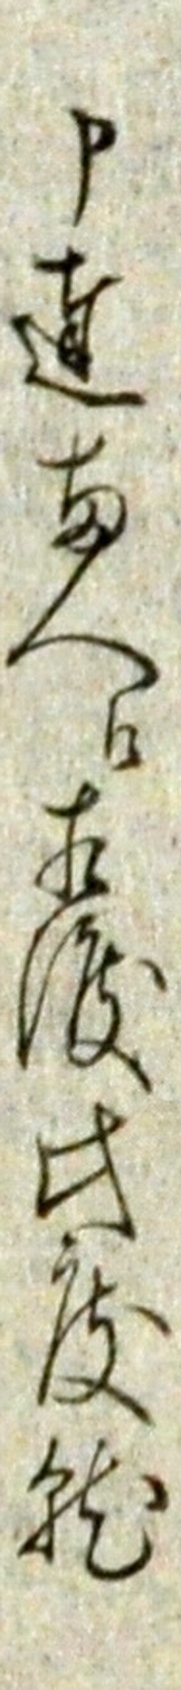申達両人へ相渡此度就
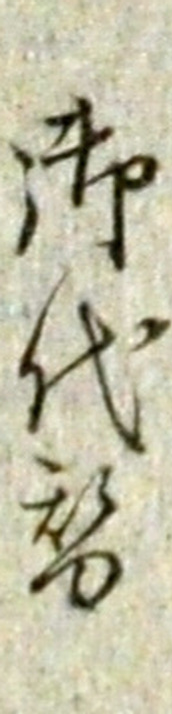御代替
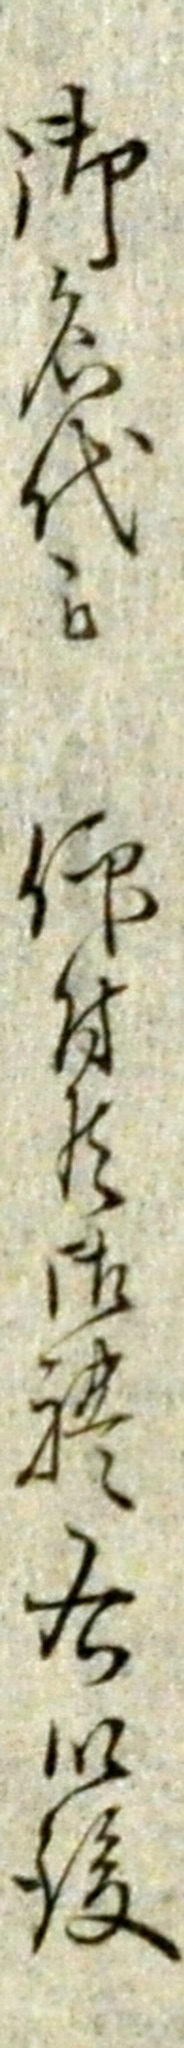御名代被仰付候御禮右以後
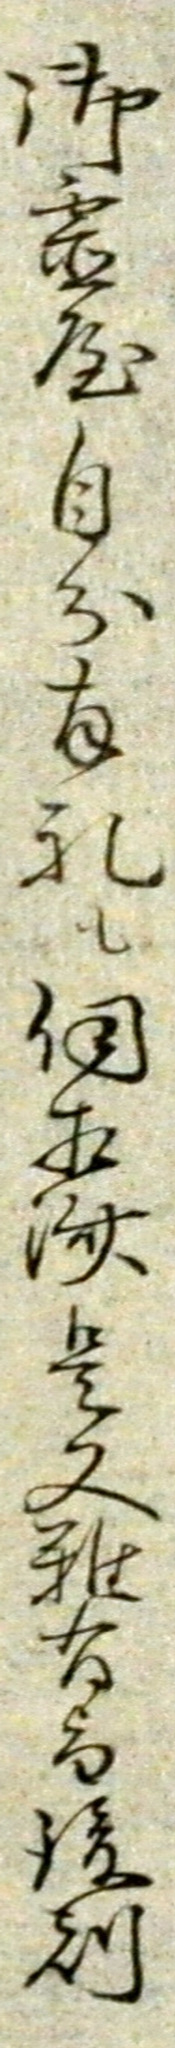御霊屋自分拝礼も伺相済是又難有旨後刻
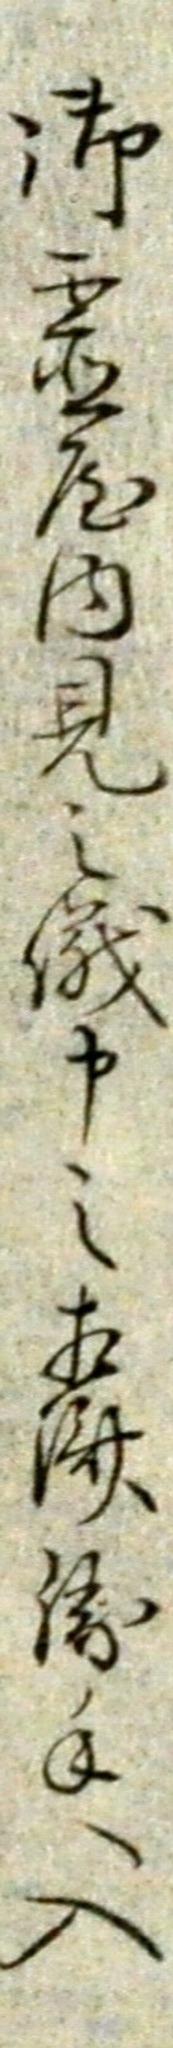御霊屋内見之儀申之相済勝手へ入
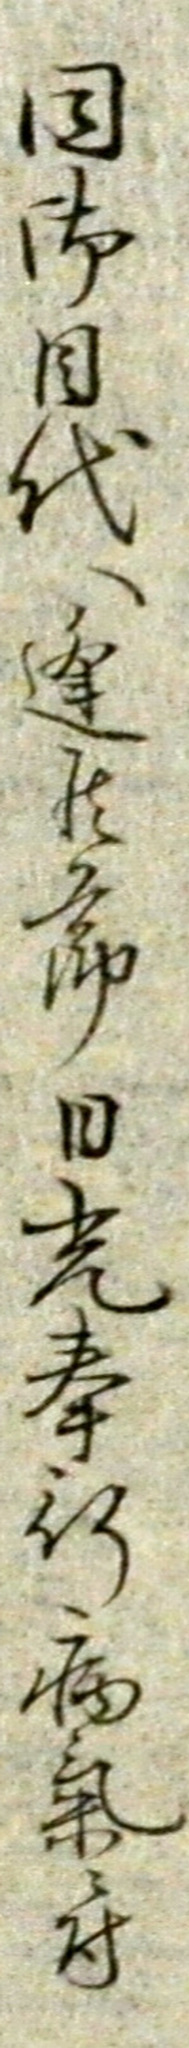同御目代へ逢候節日光奉行病気ニ付
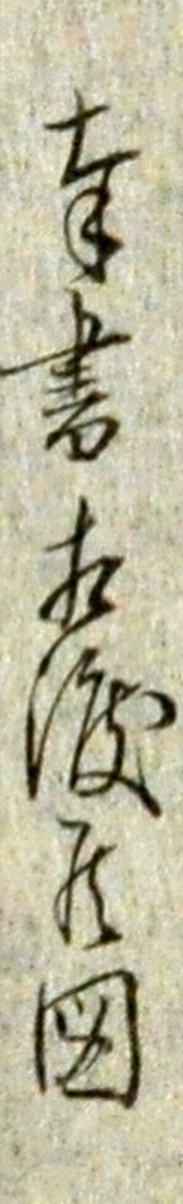奉書相渡候図

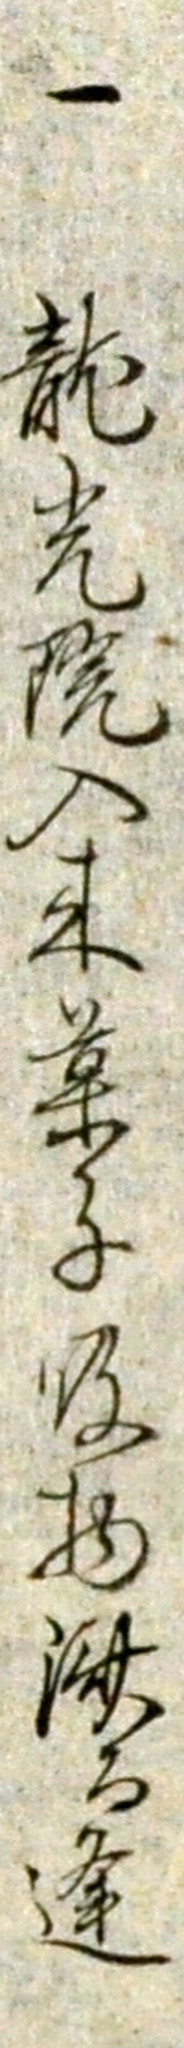一龍光院入来菓子吸物済而逢
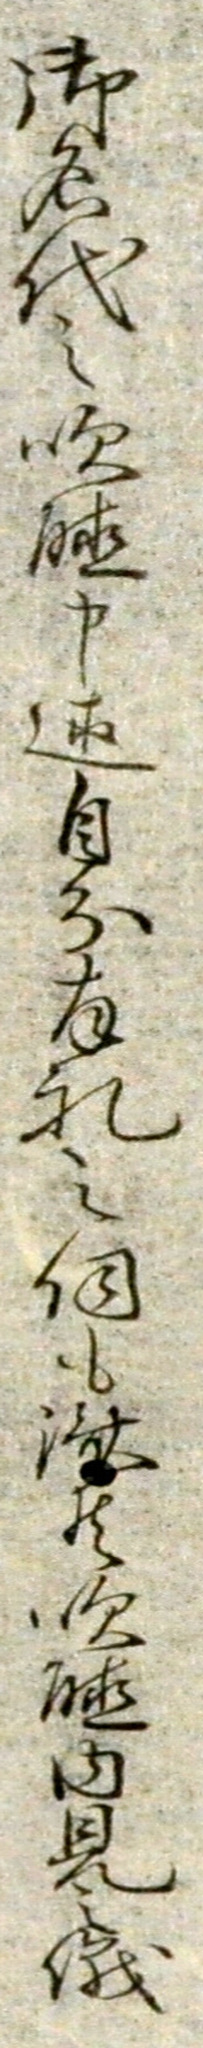御名代之吹聴申述自分拝礼之伺も済候吹聴内見之儀
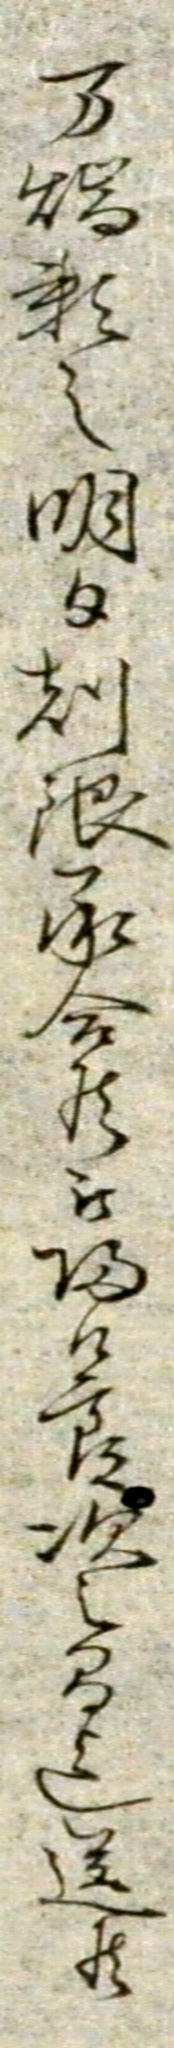万端頼之明日刻限承合候被帰候節次之間迠送候
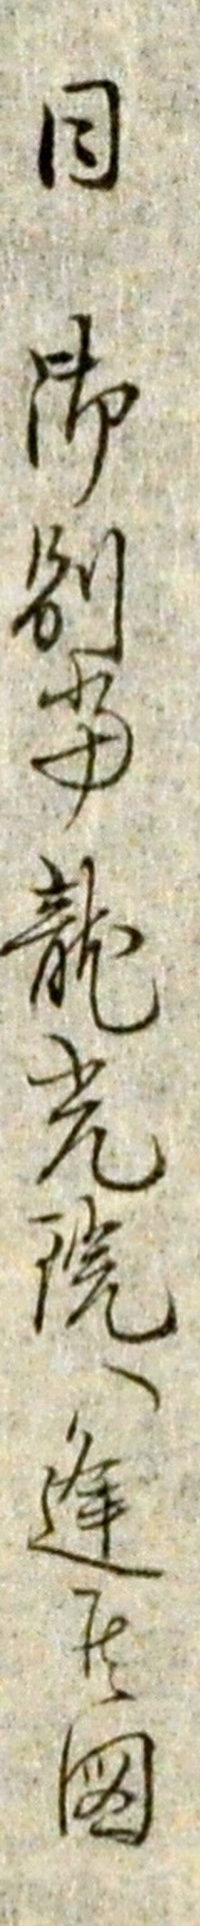同御別当龍光院へ逢候図
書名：日光御名代相勤候節ノ留
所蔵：伊那市立高遠町図書館・合同会社AMANE
